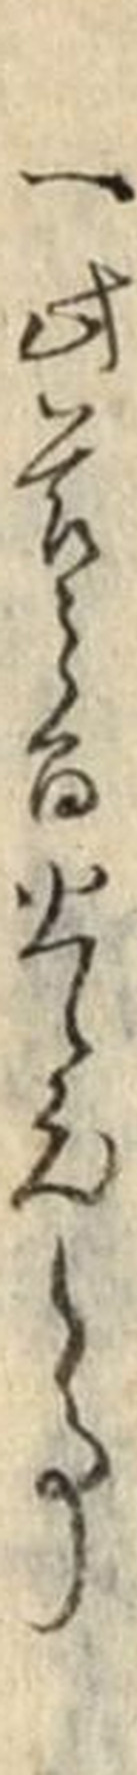一此節に候間火之元之事
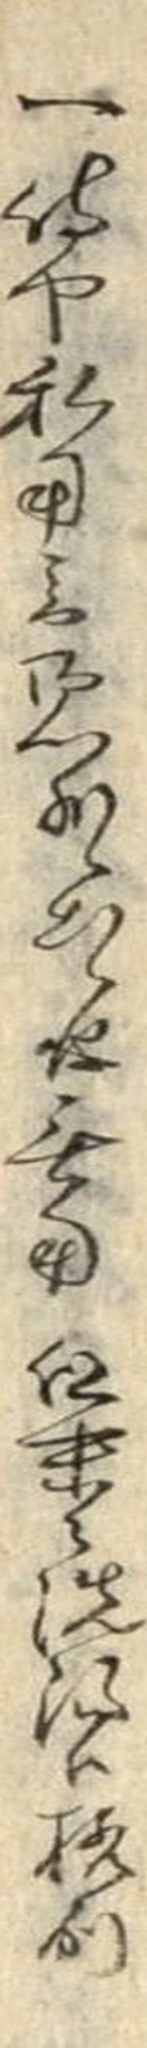一侍中私用にて御門外へ出候儀無用但末々洗湯は格別
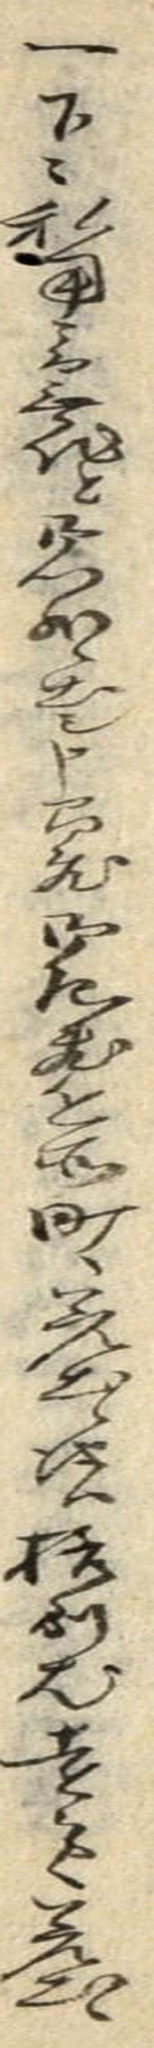一下々私用にて無作と御門外へ出シ申間敷御屋敷近所町へ差出候儀は格別尤遠方へ差出候
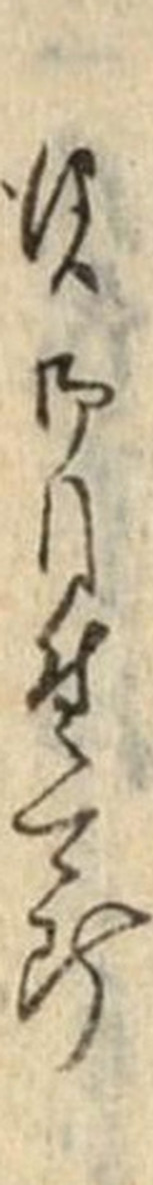儀は御目付へ可断

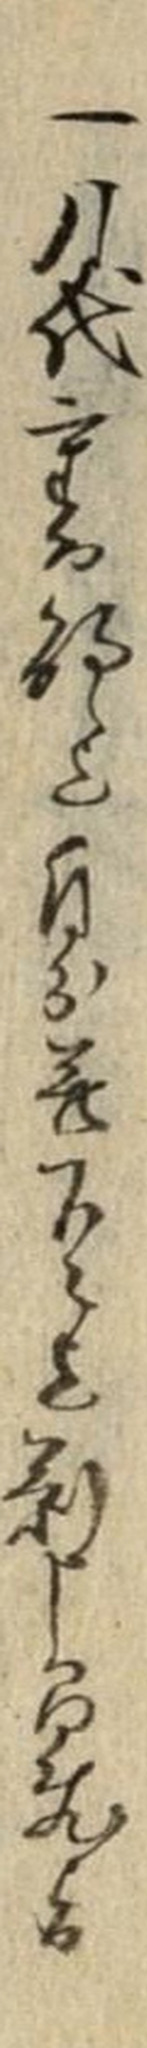一月代重て触候迄自分并下々迄剃申間敷旨
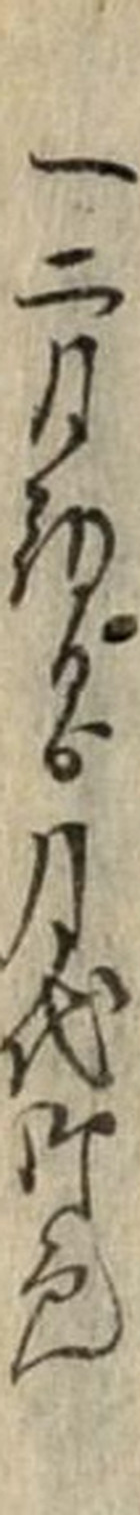一二月朔日ゟ月代御免
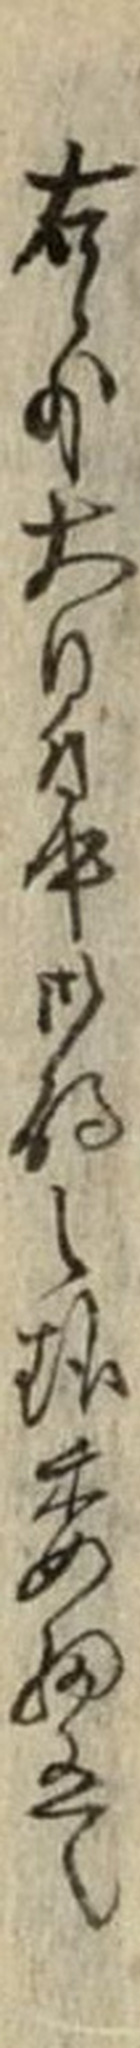右之外大目付中御触之趣委細有之
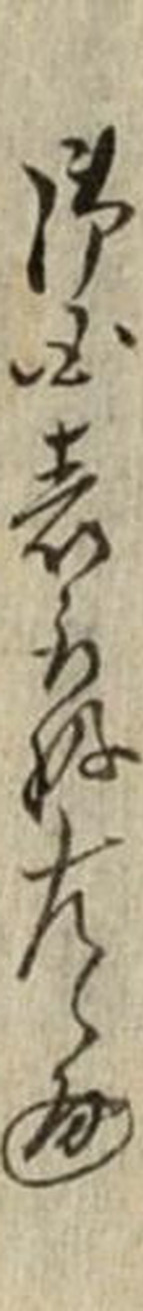御国表取扱左之通
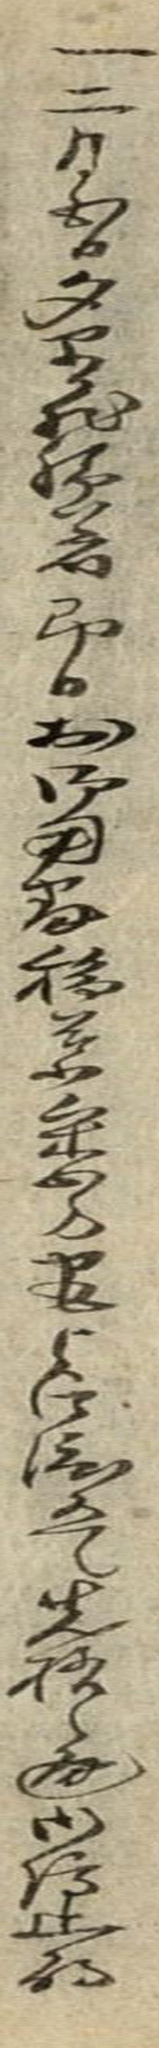一二月五日夕早飛脚着即日於御用番稲葉采女方宅被仰渡有之先格之通御停止触
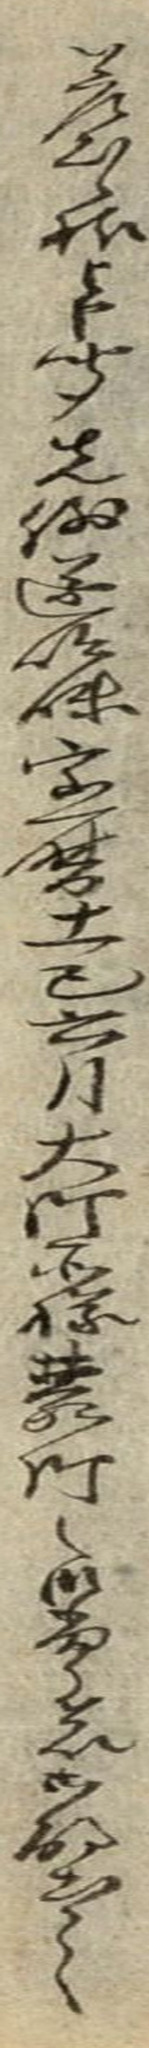差出候様被申聞先例遂吟味宝暦十一巳六月大御所様薨御之御当りを以御触出之
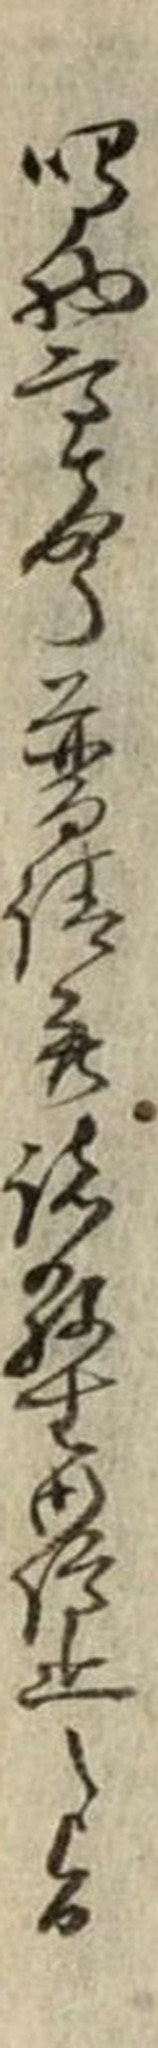鳴物高声普請并諸殺生御停止之旨
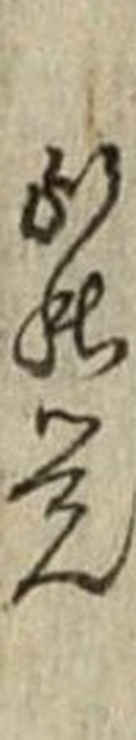別張覚
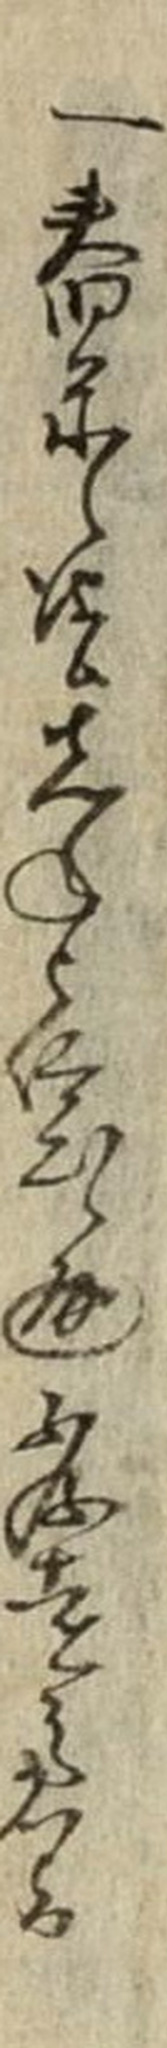一舂米之儀は先年被仰出候通不及遠慮旨
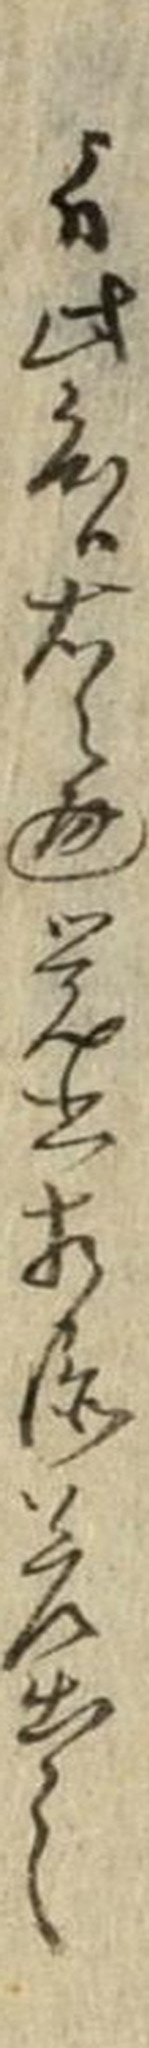に付此度は右之通覚書相添差出之
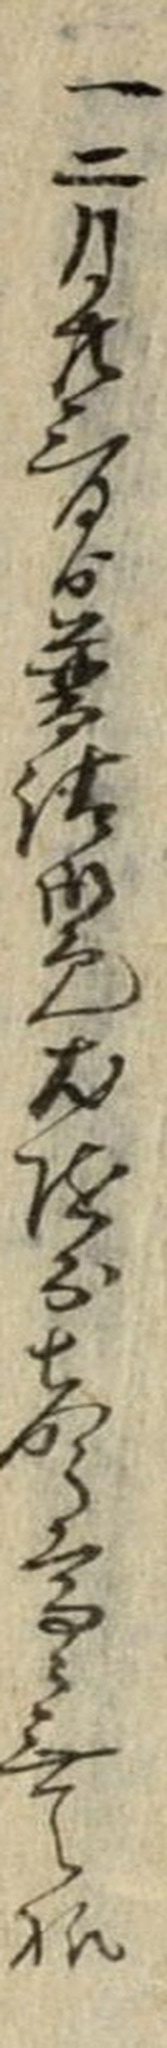一二月廿三日ゟ普請御免尤随分声高に無之様
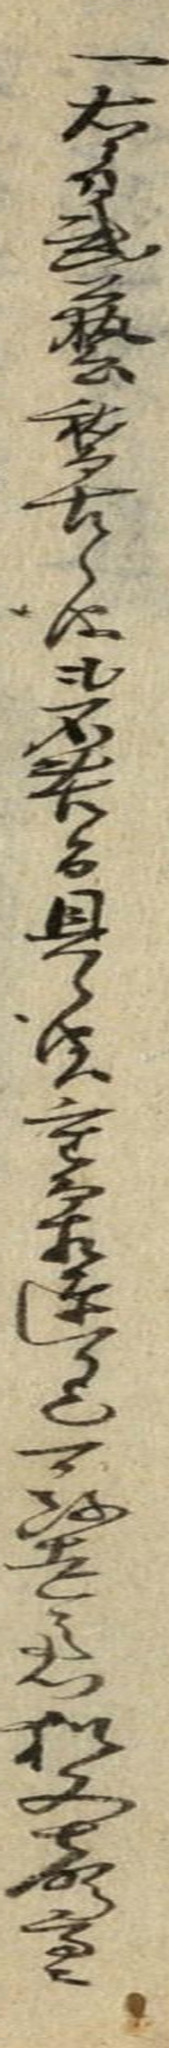一右に付武芸稽古之儀も不苦旨貝之儀は重て相達候迄可致遠慮猶又声高に
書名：御停止異変死失
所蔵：福井県文書館 Fukui Prefectural Archives
